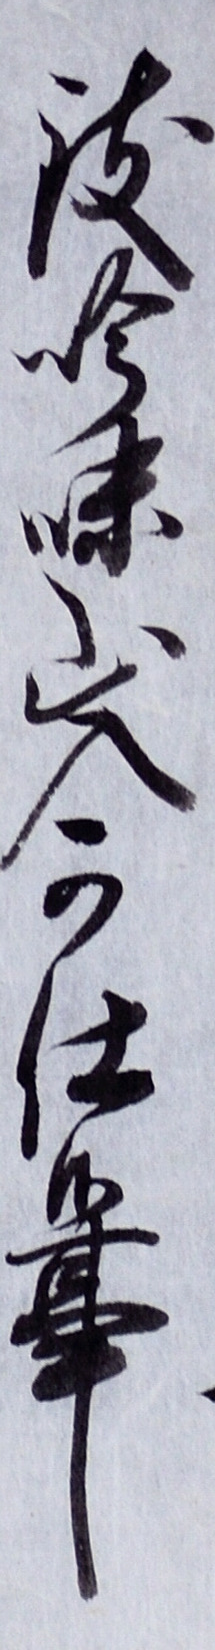致吟味山入可仕候事
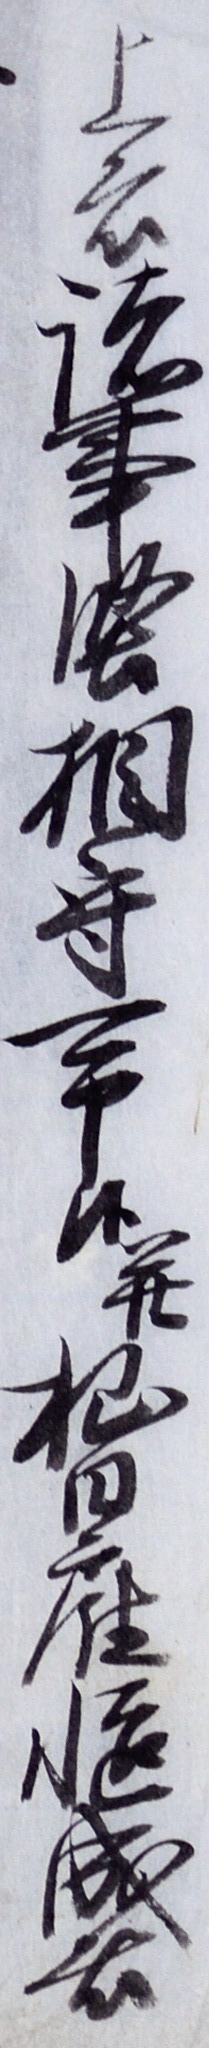上者諸事堅相守可申候并杣日雇慥成者
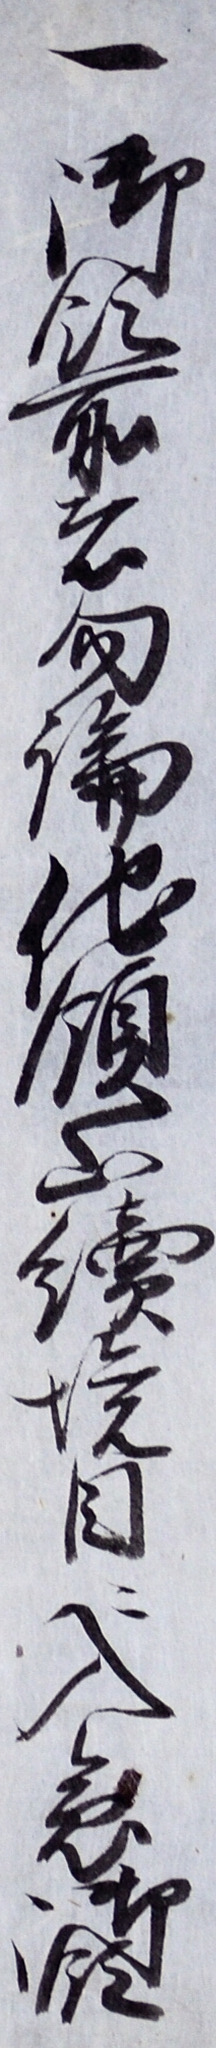一御領所者勿論他領山続境目ニ入念御領
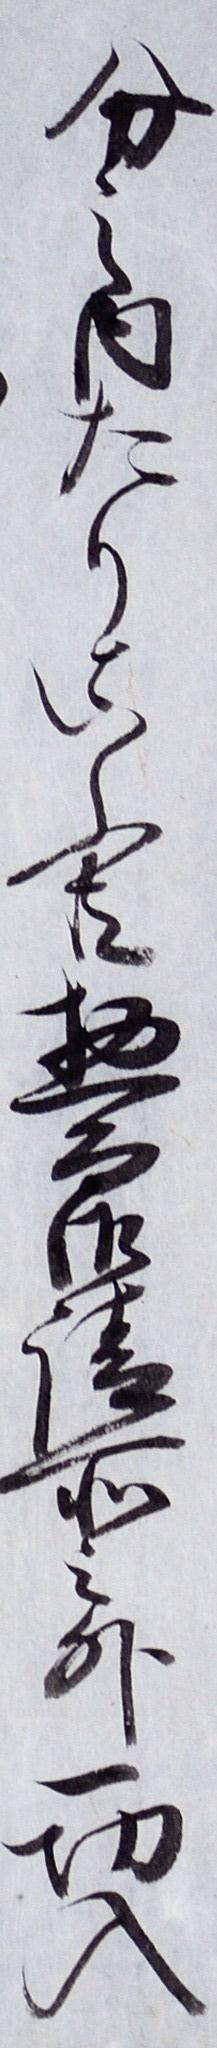分之内たりといふ共惣而御請所之外一切入
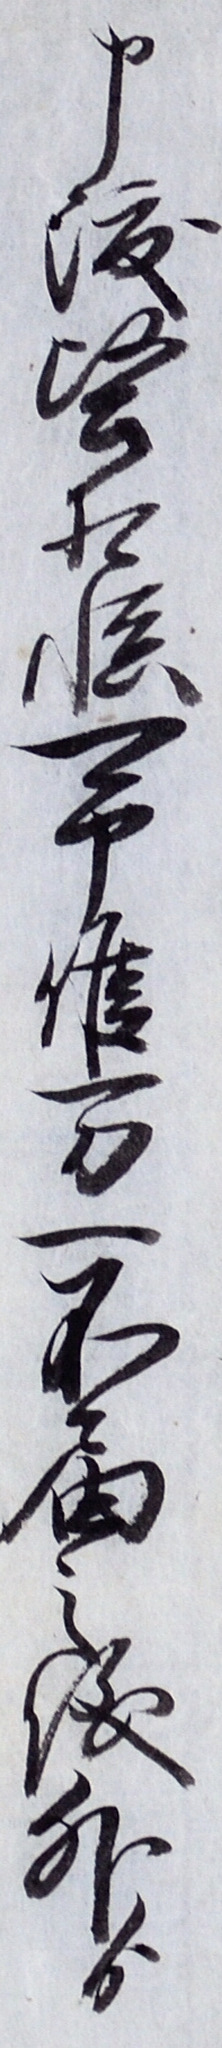申渡堅相慎可申候万一不届之儀外ゟ
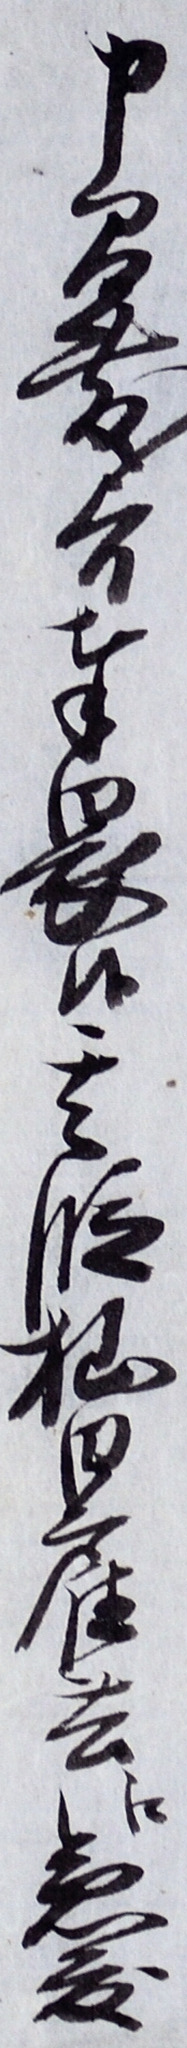申間敷旨奉畏候其段杣日雇共江急度
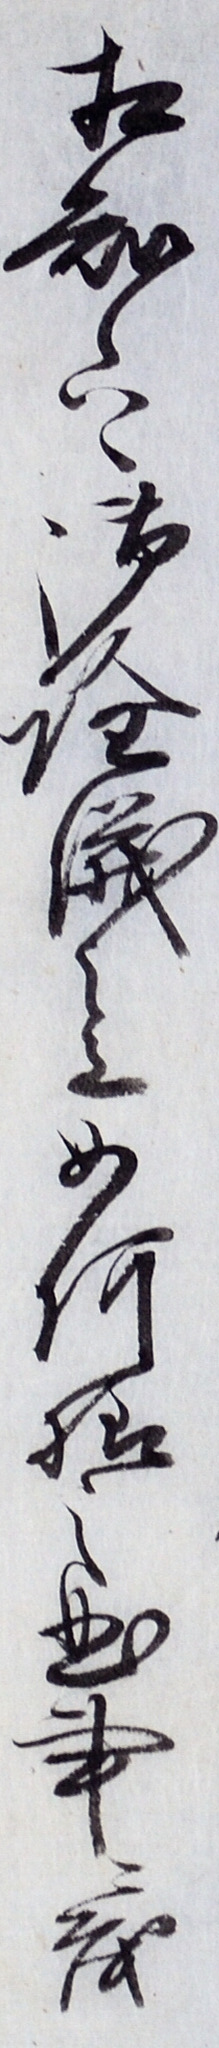相知候ハヽ御詮議之上如何様之曲事ニも
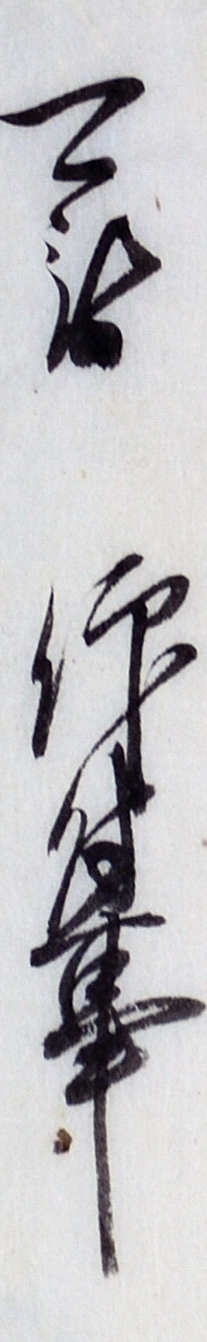可被仰付事
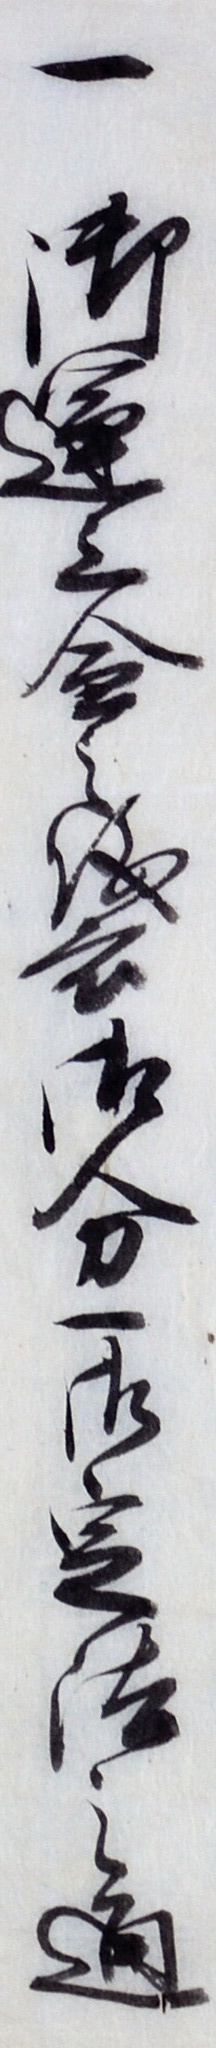一御運上金之儀者御分一御定法之通
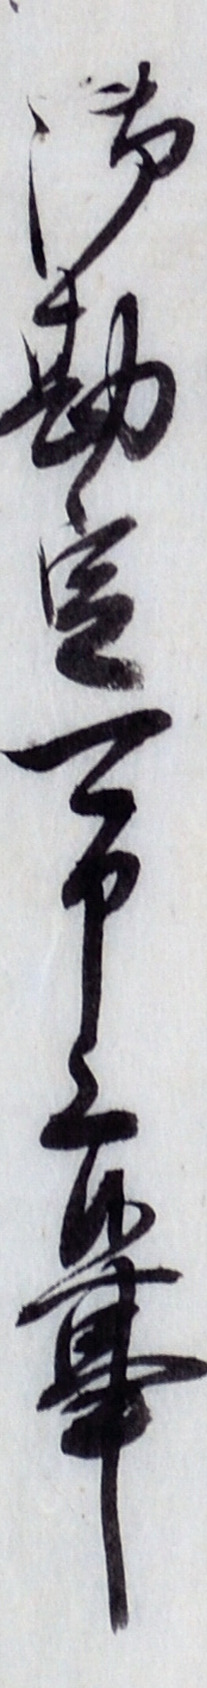御勘定可申上候事
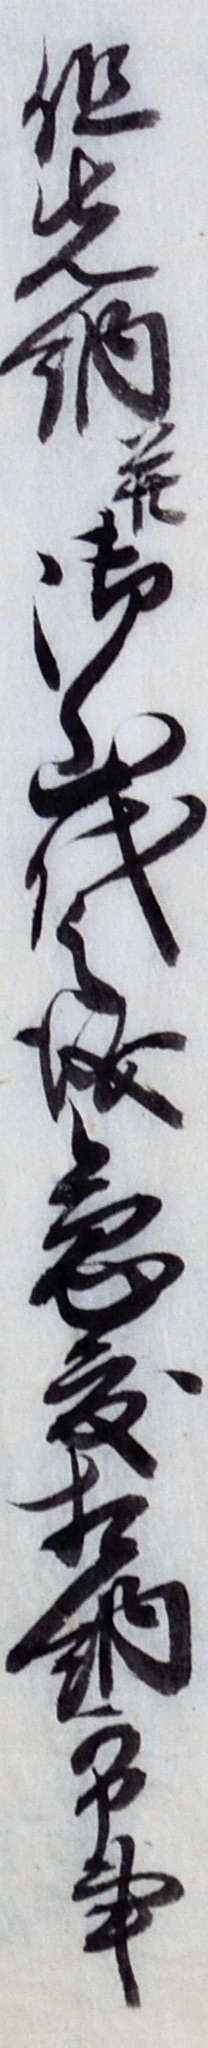但先納并御山代之儀急度相納可申事
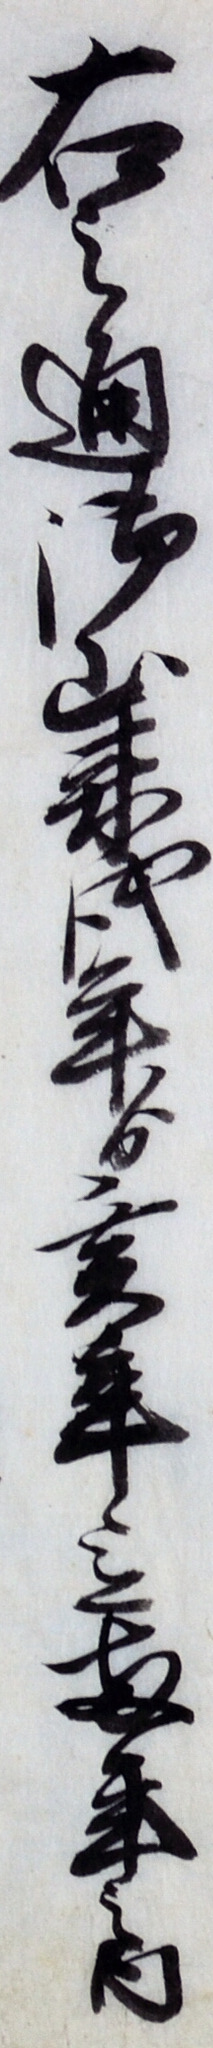右之通御山来戌年ゟ亥年迄両年之内
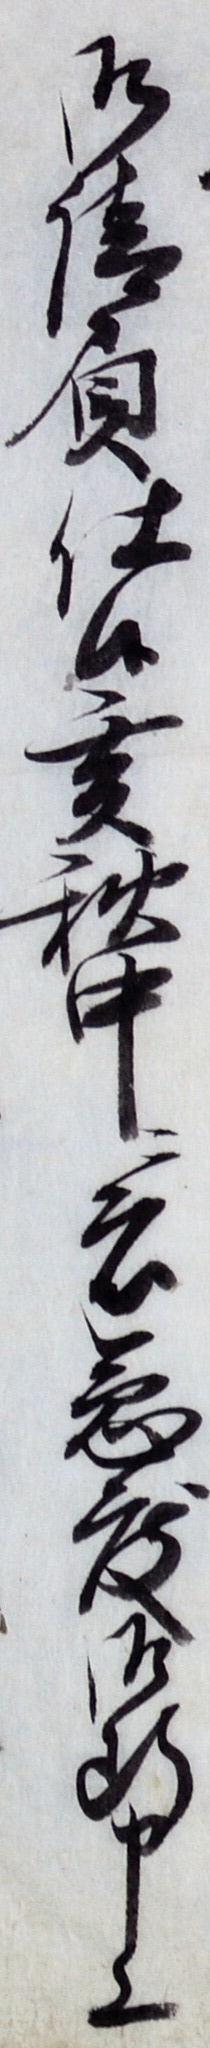御請負仕候亥秋中ニ者急度御断申上
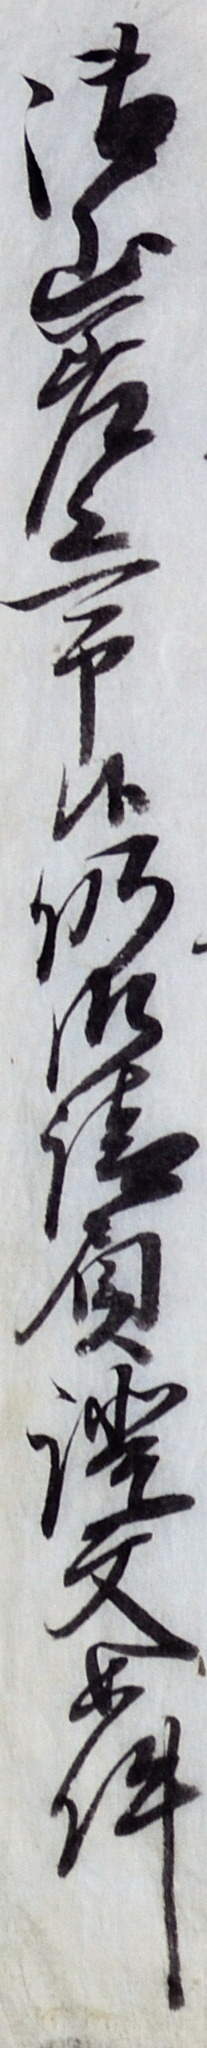御山差上可申候仍御請負証文如件

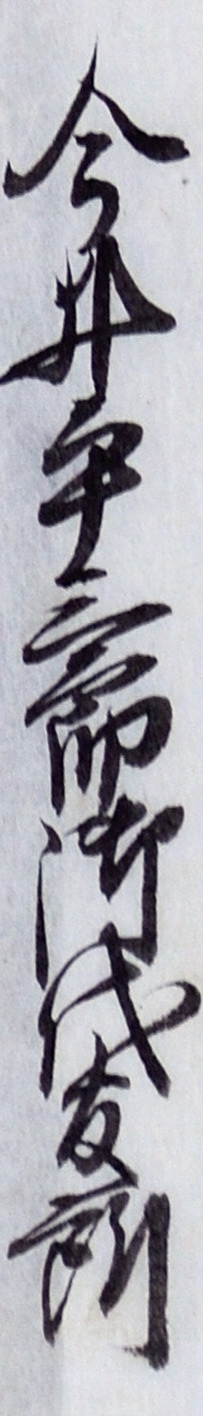今井平三郎御代官所
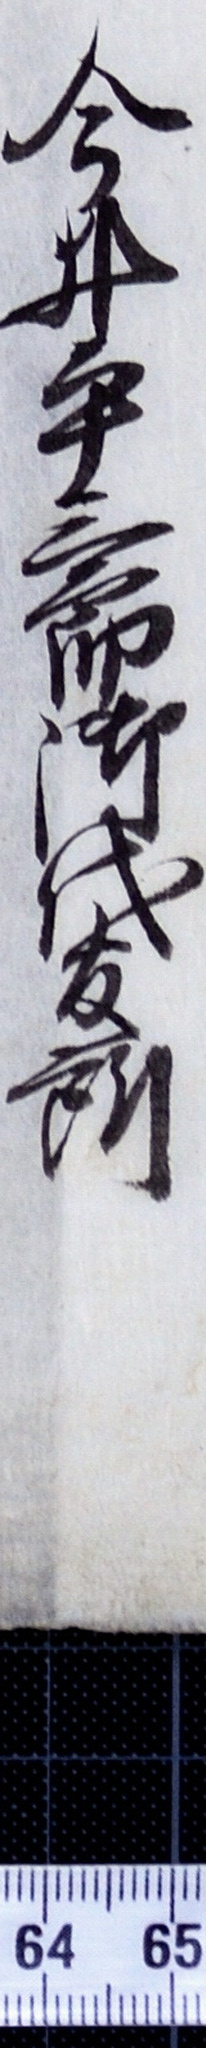今井平三郎御代官所
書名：御持山御払掟書願書控
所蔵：伊那市立高遠町図書館・合同会社AMANE
